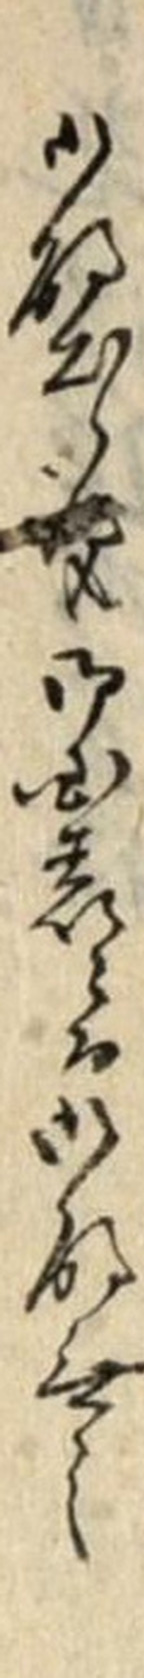御触出候得共御国表にて御触無之

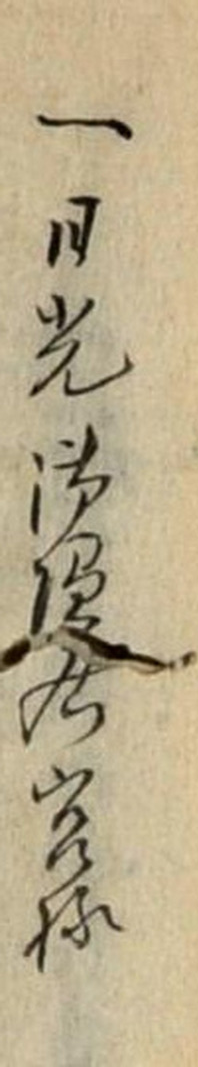一日光御隠居宮様
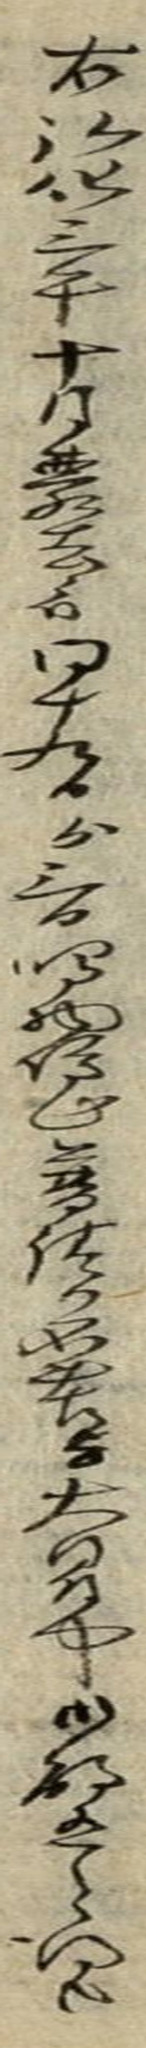右弘化三午十月薨去に付同十九日ゟ三日鳴物停止普請は不苦旨大目付中御触有之候得共
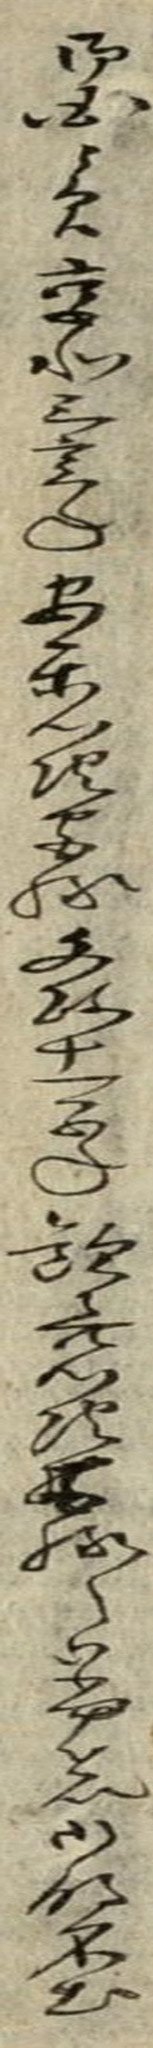御国にては享和三亥年安楽心院宮様文政十一子年歓喜心院宮様之御当を以御触不出
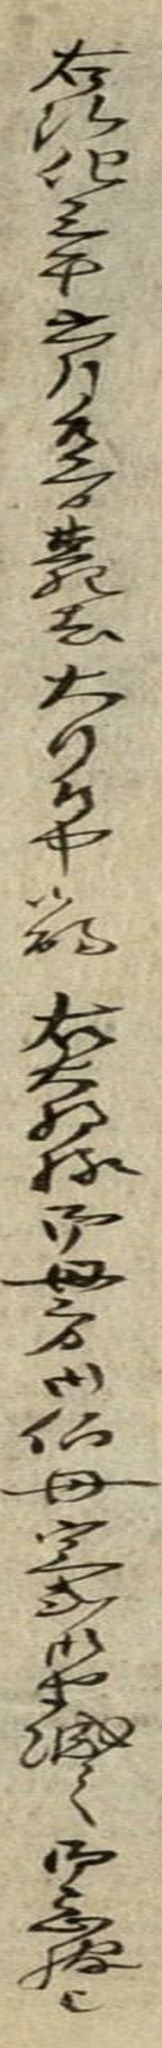右弘化三午六月廿二日薨去大目付中御触右大将様御母方御伯母定式御半減之御忌服被
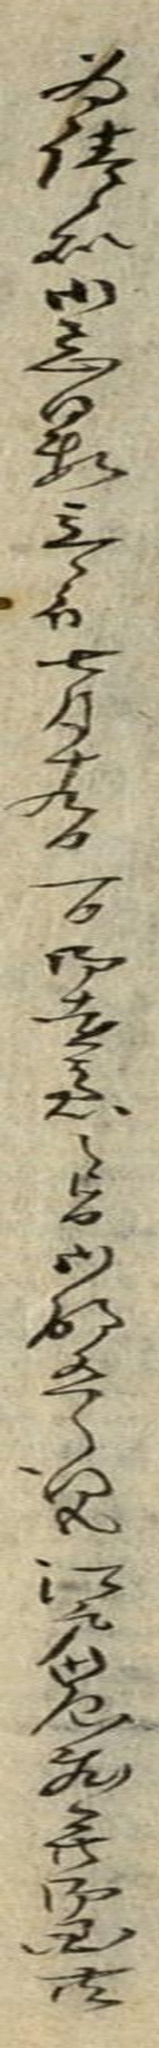為請候処御忌日数立候に付七月十九日一日御遠慮之旨御触有之候得共江戸御屋敷并御国共
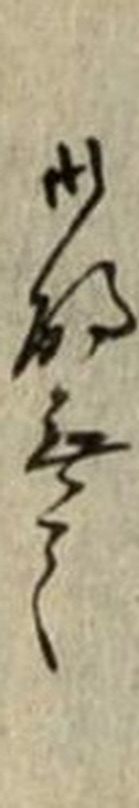御触無之
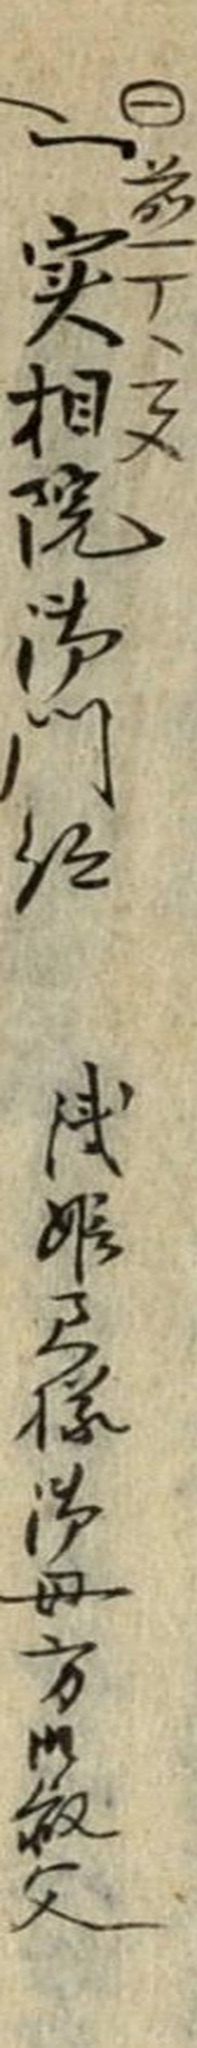一実相院御門跡浅姫君様御母方御叔父
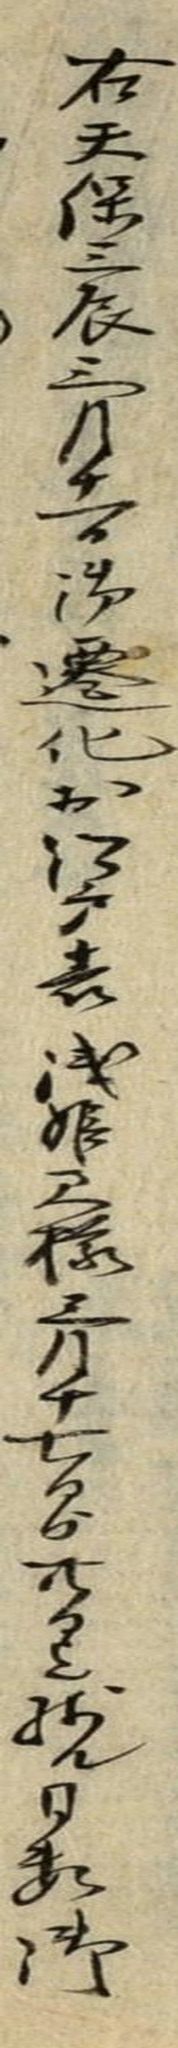右天保三辰三月十一日御遷化於江戸表浅姫君様三月十七日ゟ廿日迄残ル日数御
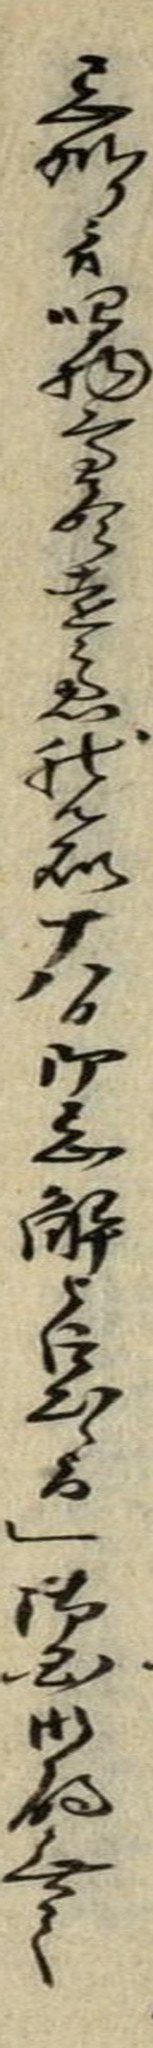忌掛りに付鳴物高声遠慮然ル処十八日御忌解被仰出候旨」御国御触無之
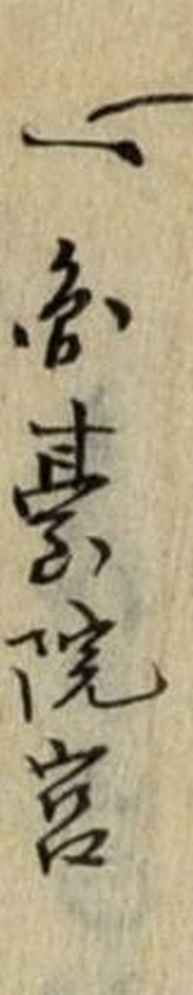一円台院宮
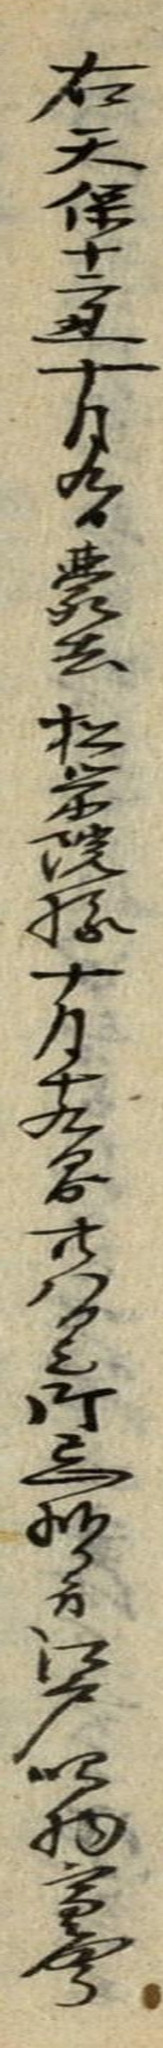右天保十二丑十月九日薨去松栄院様十月十九日ゟ廿八日迄御忌掛りに付江戸鳴物高声
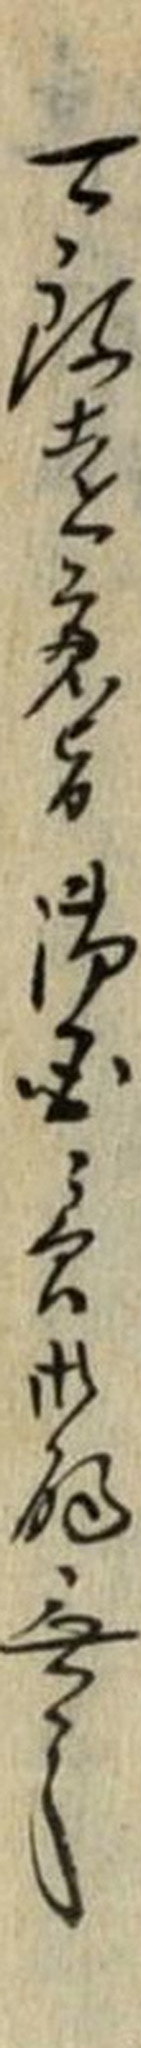可致遠慮旨御国にては御触無之

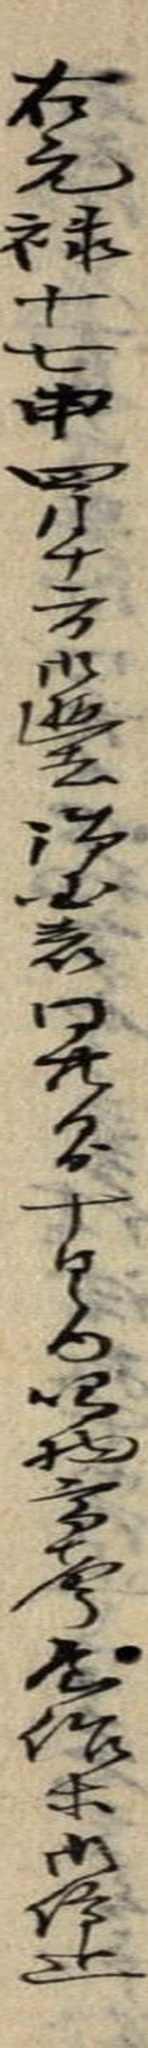右元禄十七申四月十二日御逝去御国表同廿日ゟ十日之内鳴物高声屋作等御停止
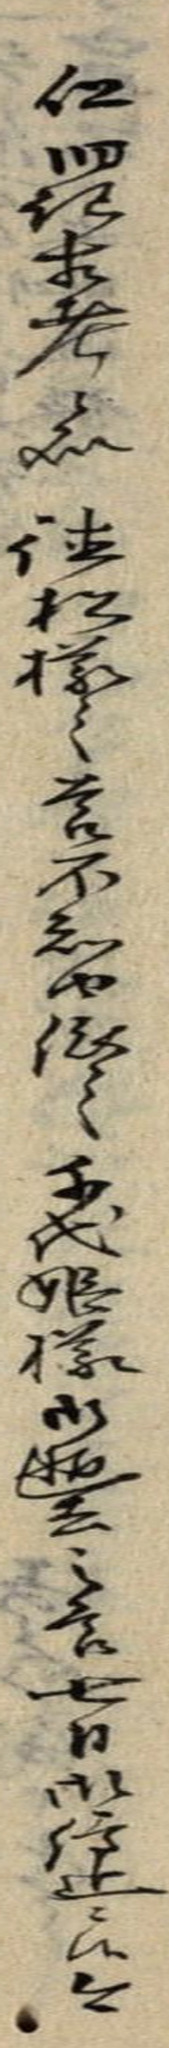但旧記相考候処徳松様之節不知由依之千代姫様御逝去之節七日御停止に候今
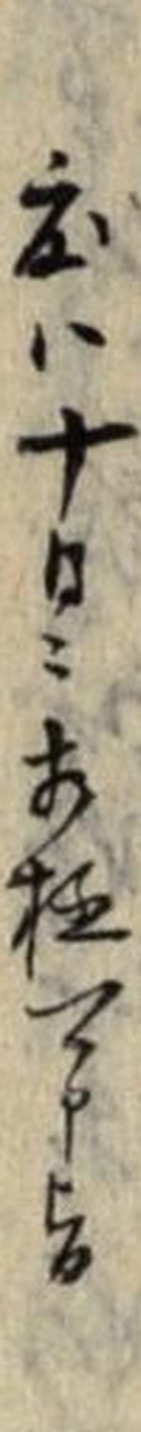度は十日に相極可申旨
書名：御停止異変死失
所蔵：福井県文書館 Fukui Prefectural Archives
